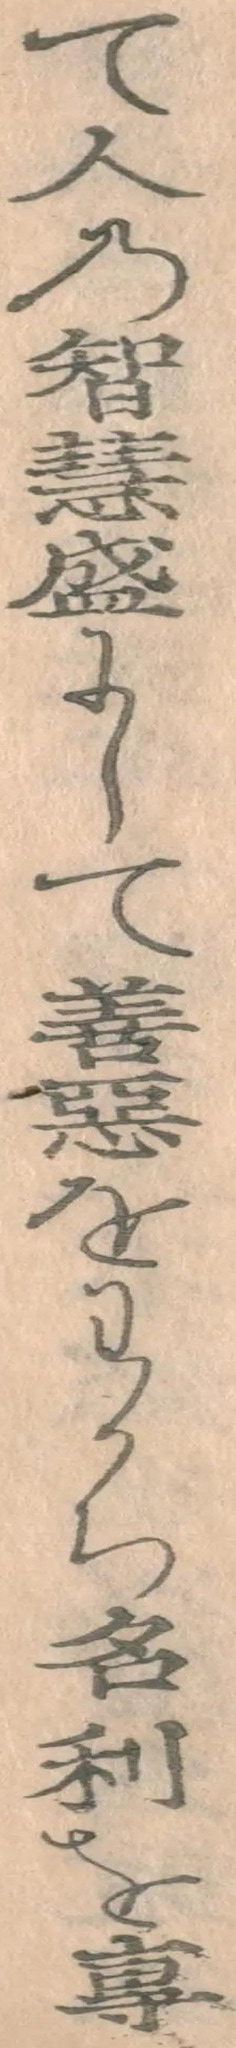て人の智慧盛にして善悪をわかち名利を専
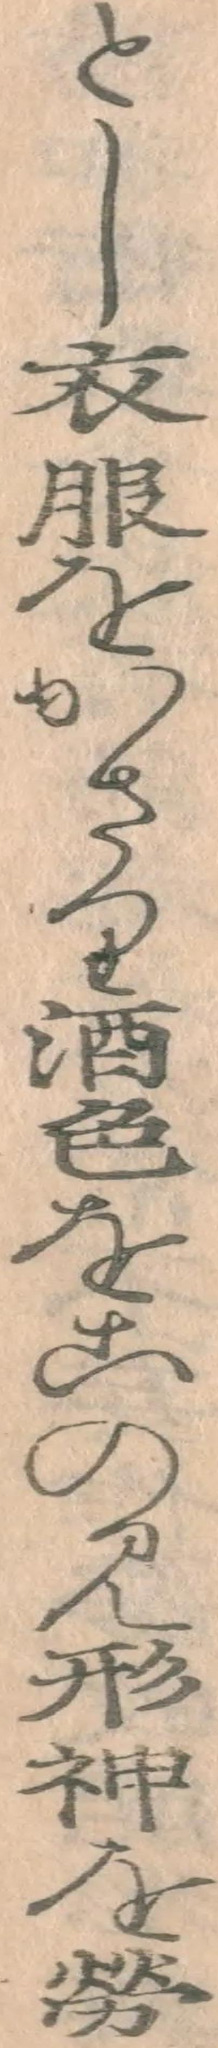とし衣服をかさり酒色をこのみ形神を労
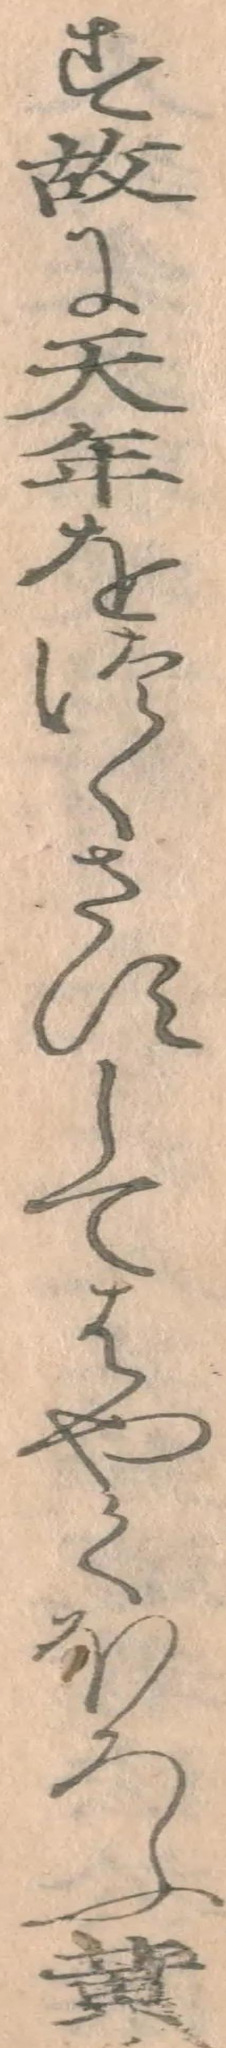す故に天年をつくさすしてはやくほろふ黄
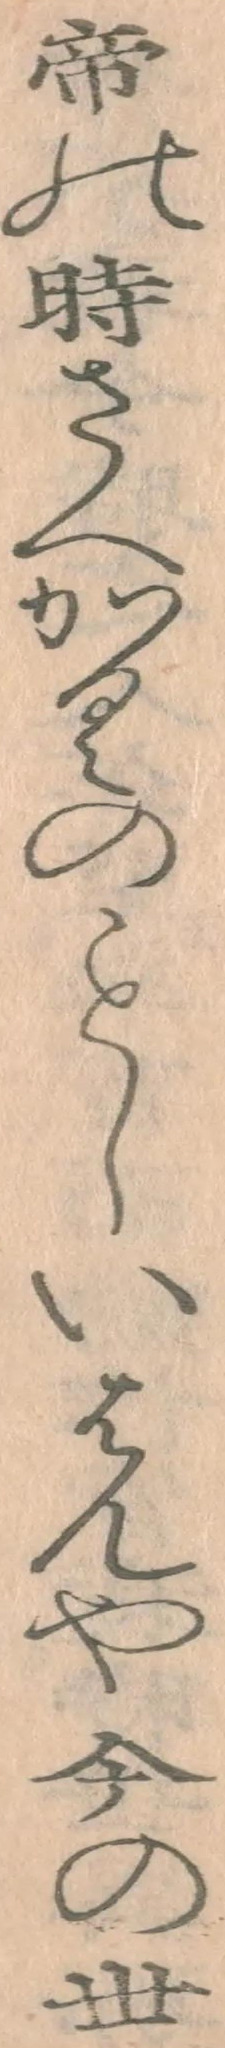帝の時さへかくのことしいはんや今の世
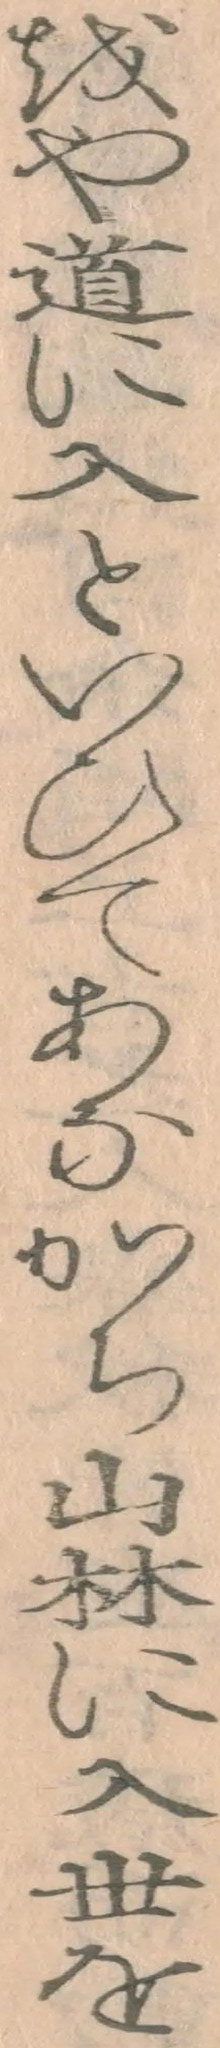をや道に入といひてあなかち山林に入世を
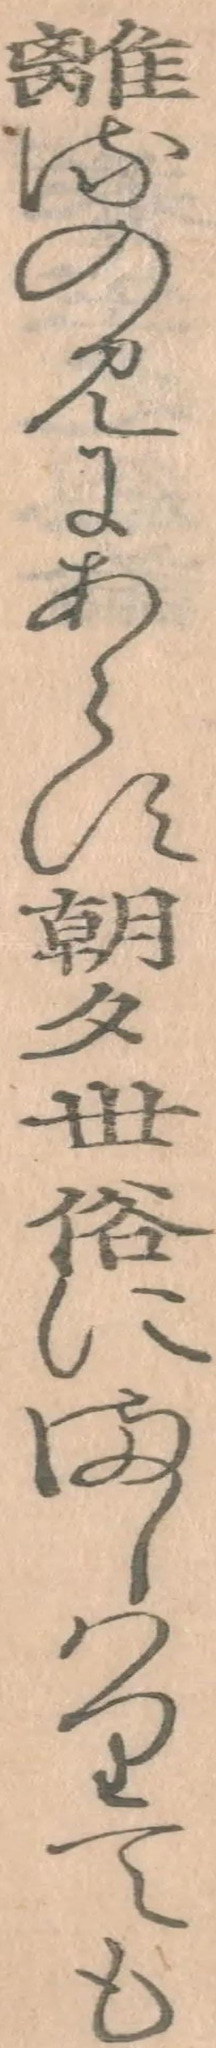離るのみにあらす朝夕世俗にましはりても
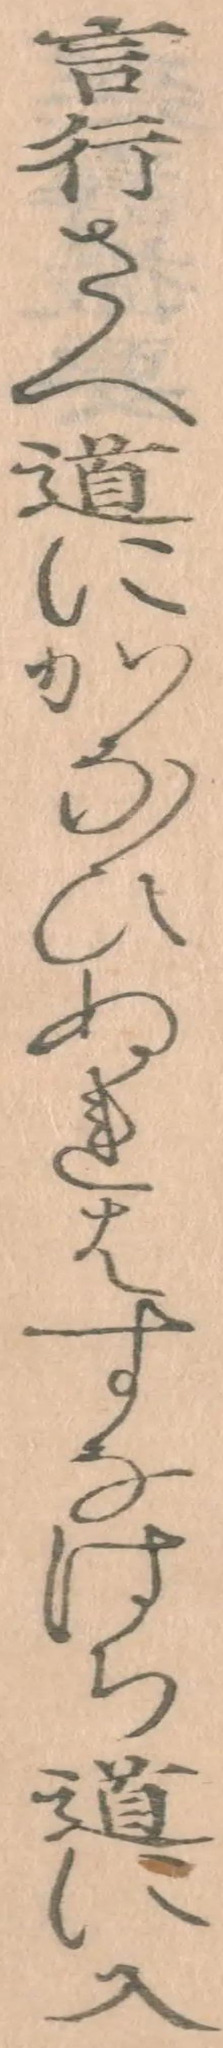言行さへ道にかなひぬれはすなはち道に入
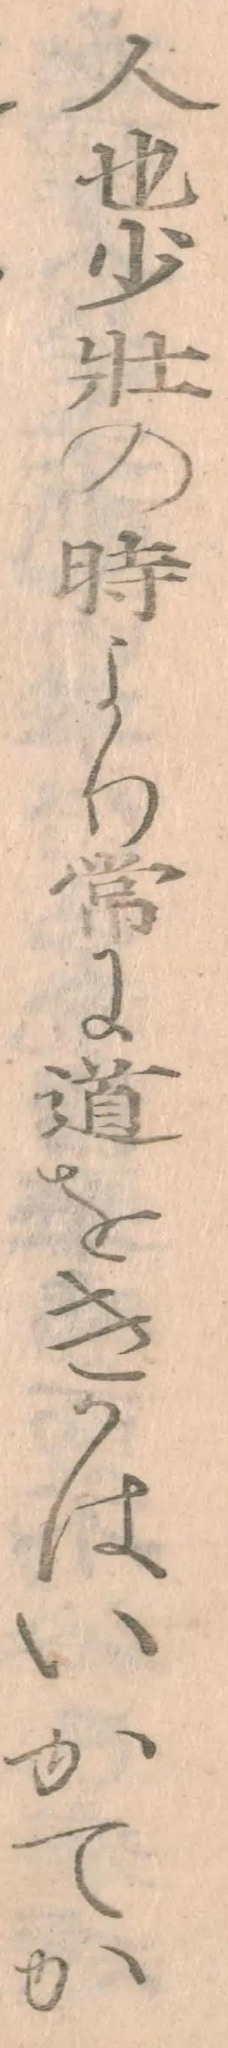人也少壮の時より常に道をきかはいかてか
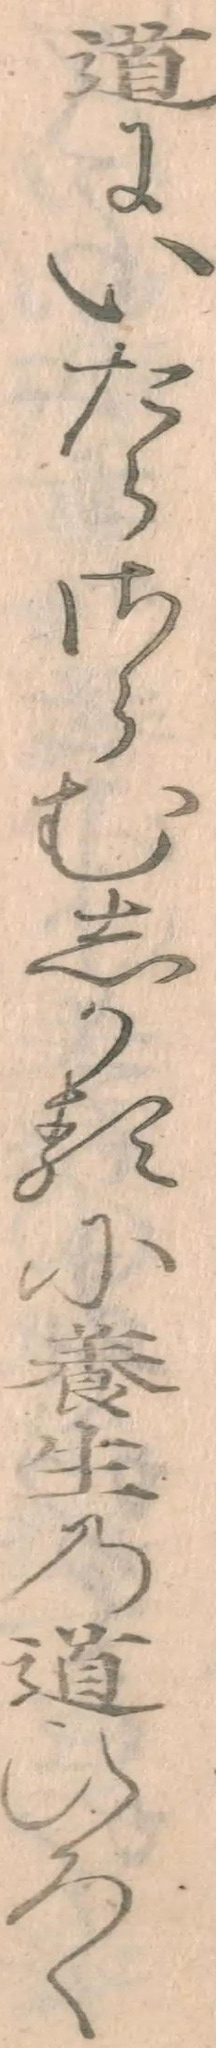道にいたらさらむしかるに養生の道いろ〳〵
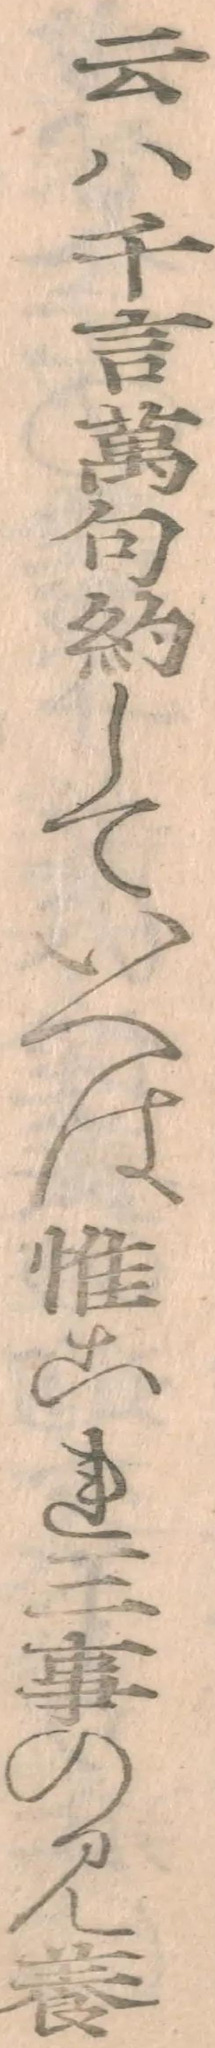云は千言万句約していへは惟これ三事のみ養
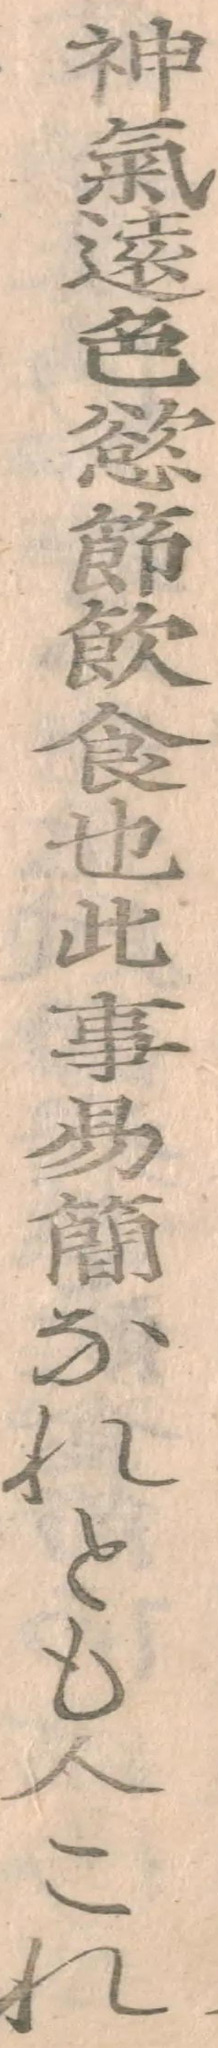神気遠色慾節飲食也此事易簡なれとも人これ
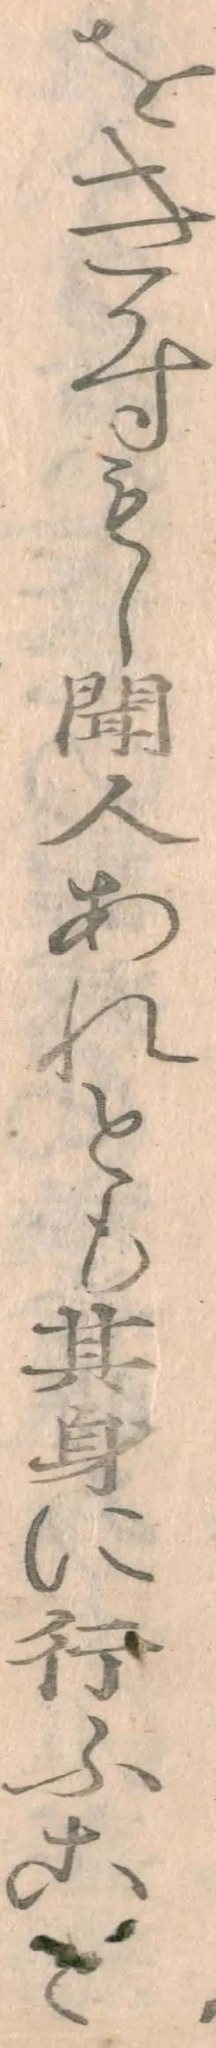をきかすもし聞人あれとも其身に行ふこと
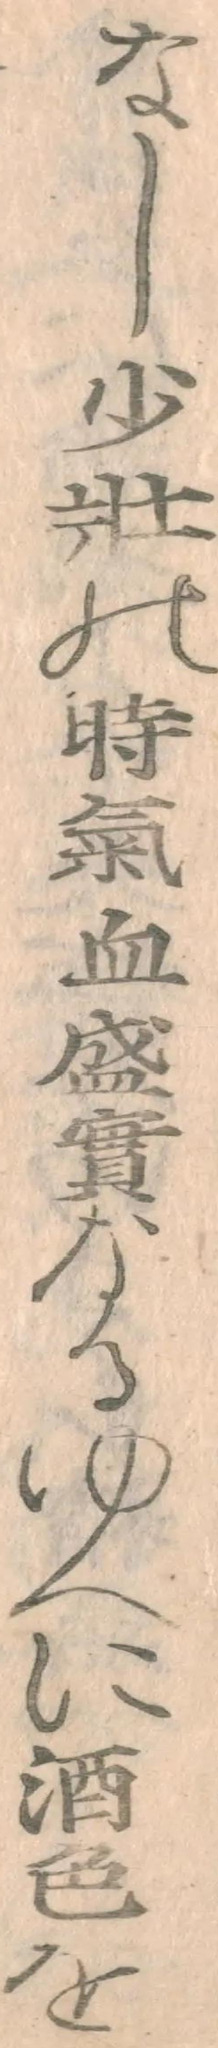なし少壮の時気血盛実なるゆへに酒色を
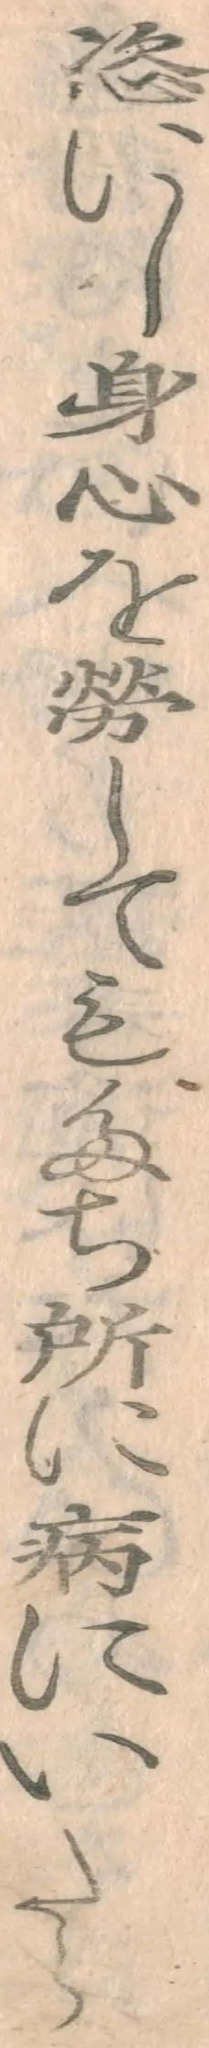恣にし身心を労しても忽ち所に病にいたら
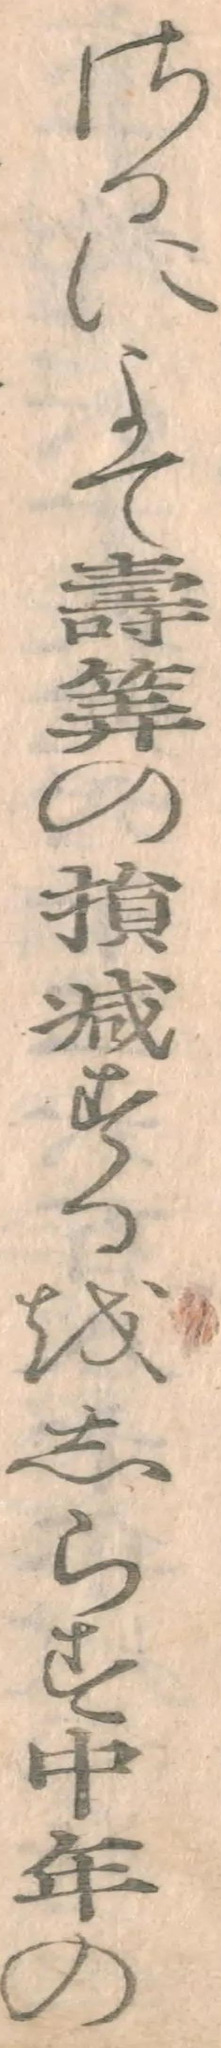さるによて寿算の損減するをしらす中年の
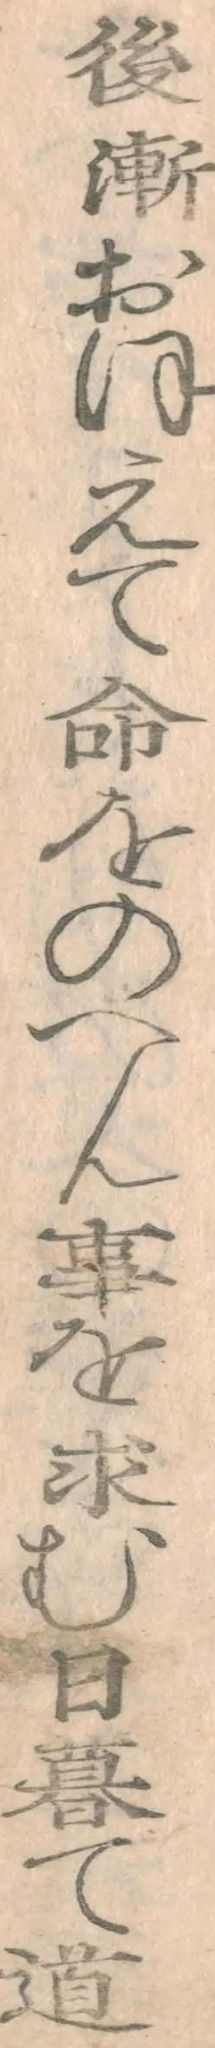後漸おほえて命をのへん事を求む日暮て道
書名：延壽撮要
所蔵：国立国会図書館 National Diet Library, JAPAN
